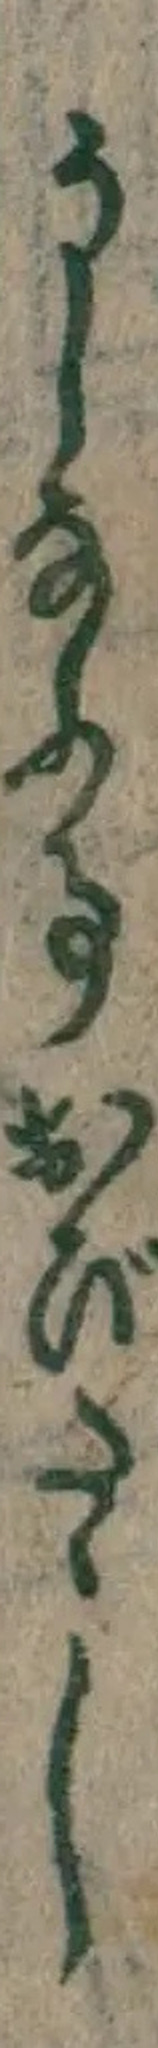うしなふ事おびたゝし
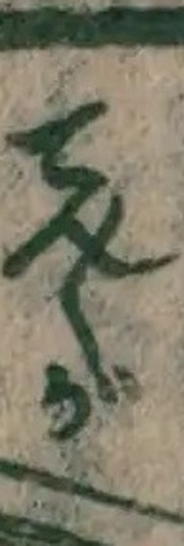てん〳〵が
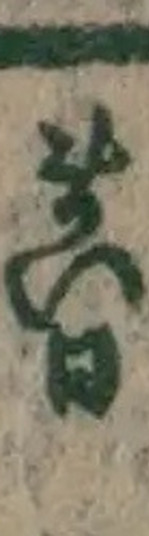まい日
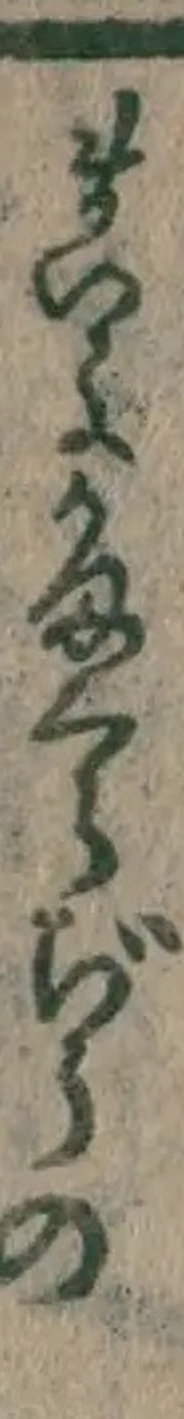まいよかまくらぢうの
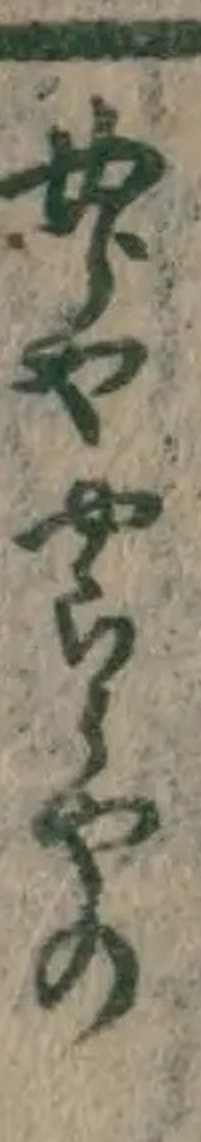女らややらうやの
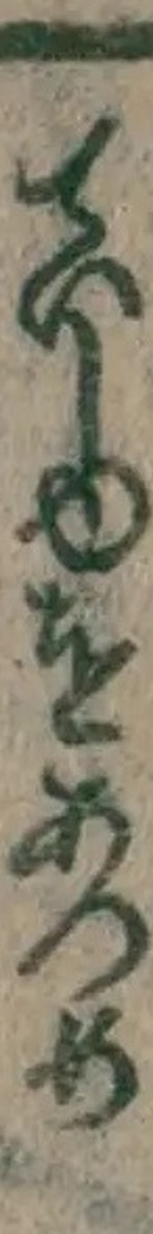ていしゆをあつめ
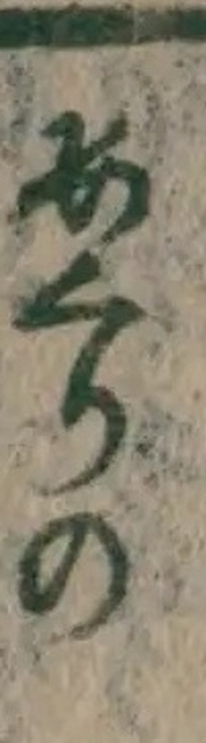めくりの
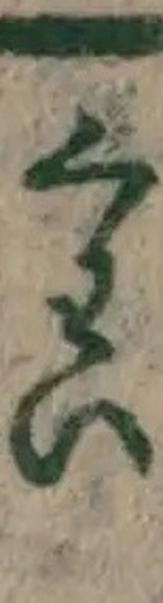くわい
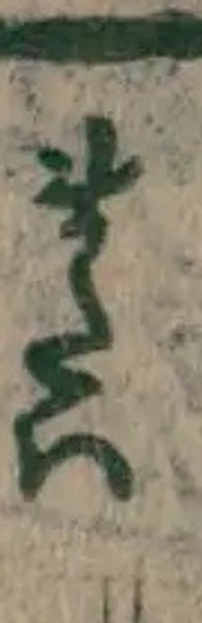または
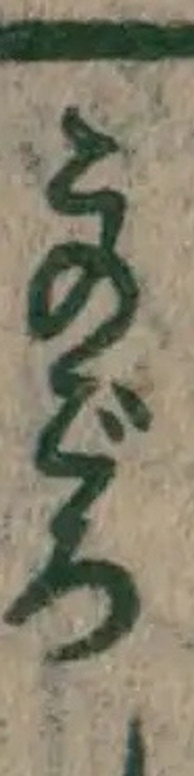このごろ
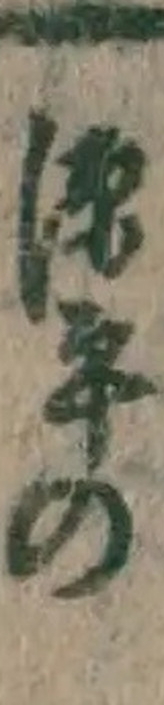源平の
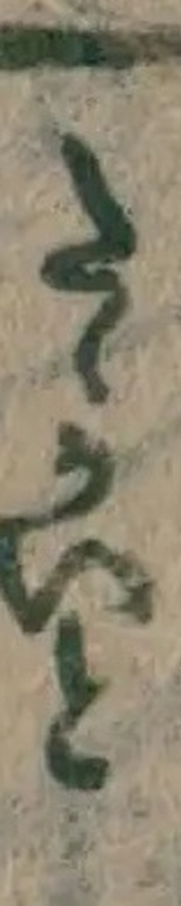たゝかいと

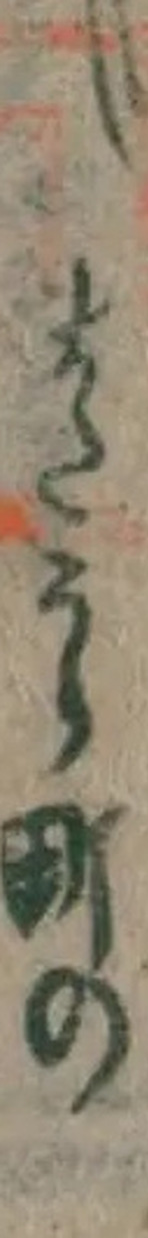またうら町の
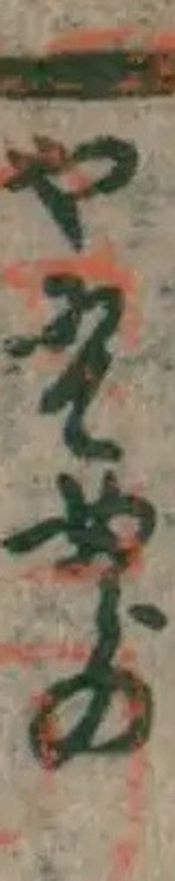やにて女らの
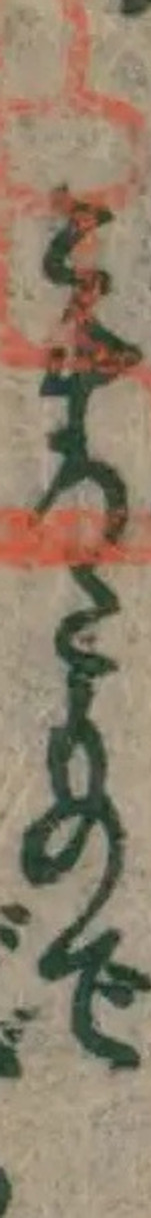こまつたもので
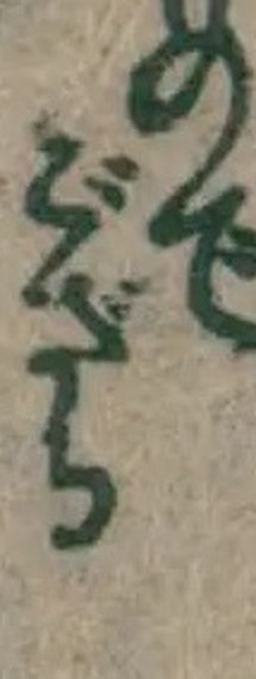ござる
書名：頓作時雨月 3巻
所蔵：国立国会図書館 National Diet Library, JAPAN
